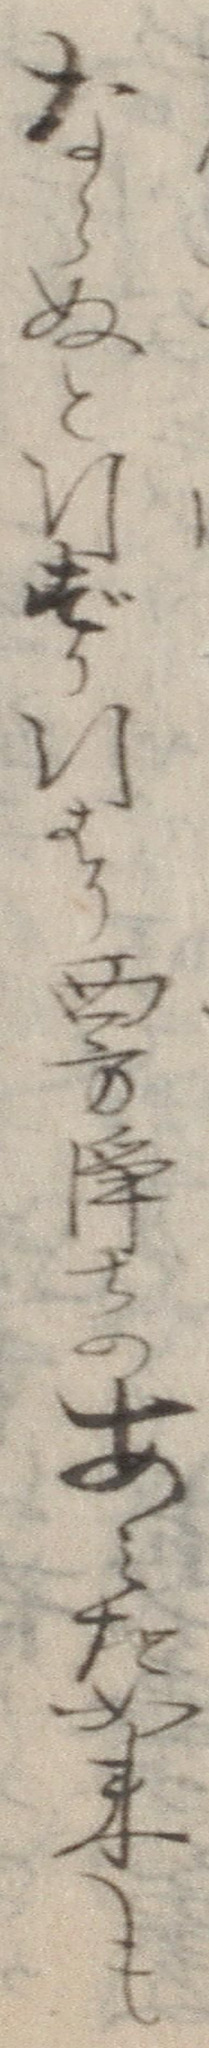ならぬと引ずり引はり西方浄土のあミた如来も
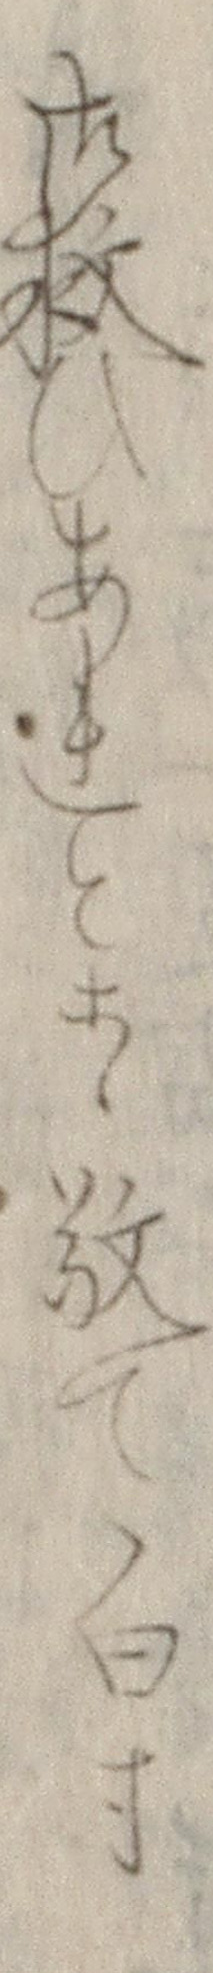御救ひあれと等々敬て白す
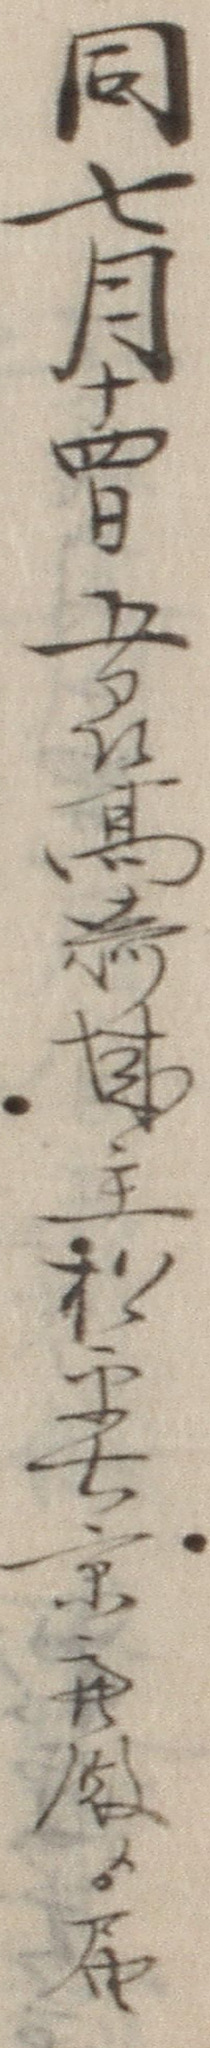同七月十四日上州高崎城主松平右京亮殿ゟ届
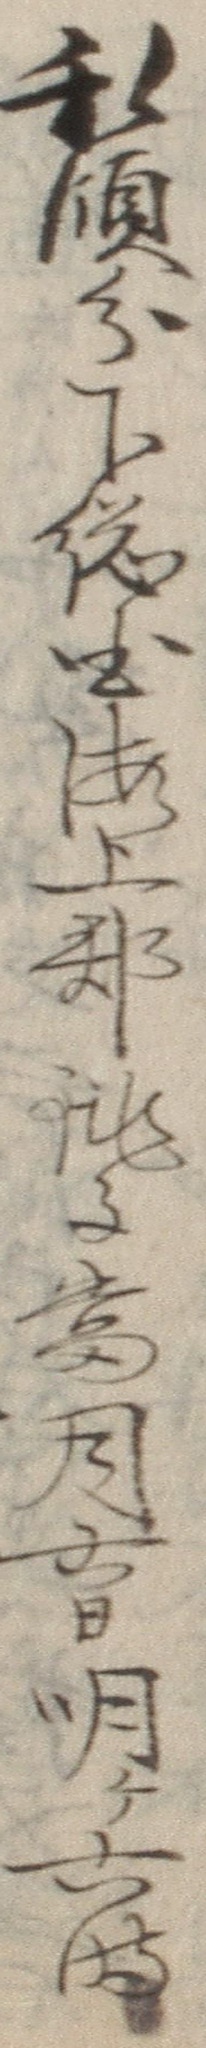私領分下総国海上郡銚子当月六日明ケ六時
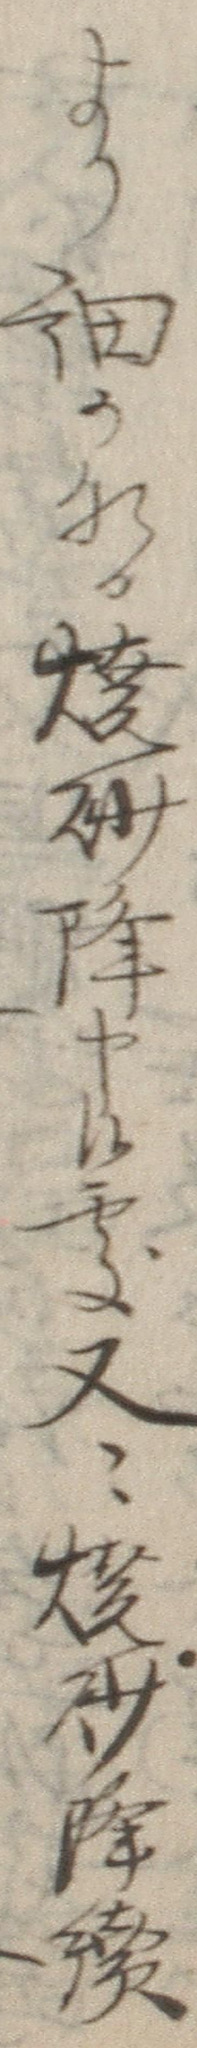より細かなる焼砂降申候処又々焼砂降続
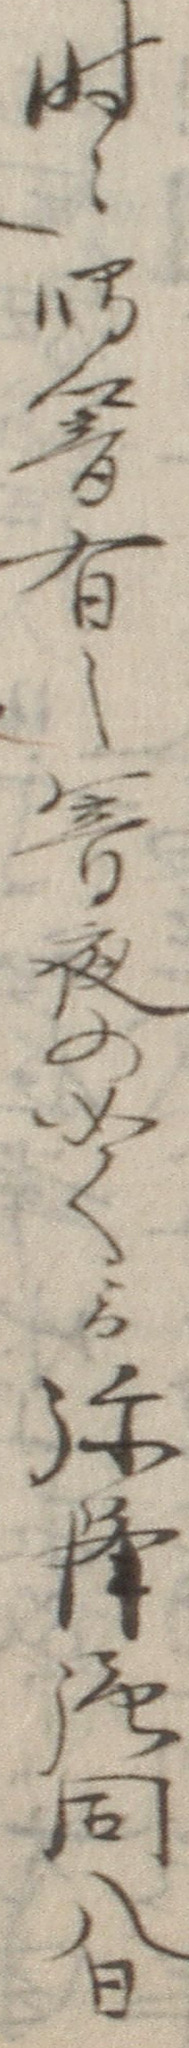時々鳴響有之闇夜の如くニ而弥降強同八日
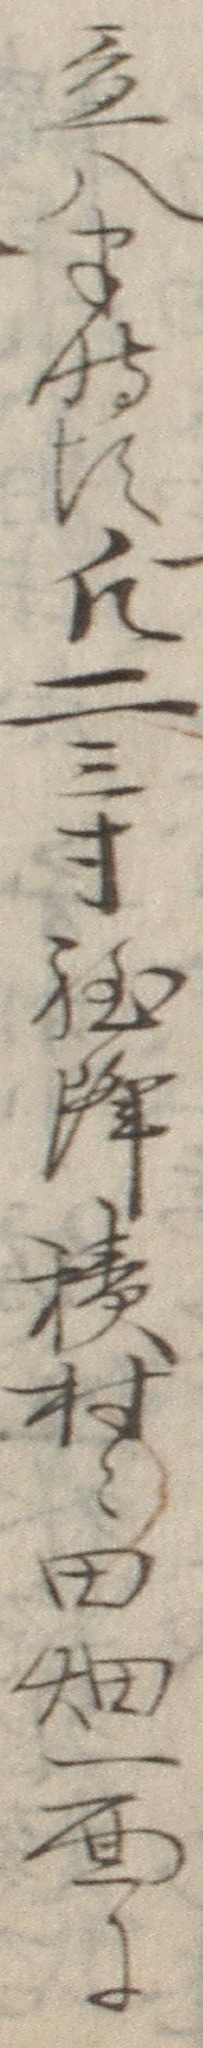昼八半時頃凡ニ三寸程降積村々田畑一面に
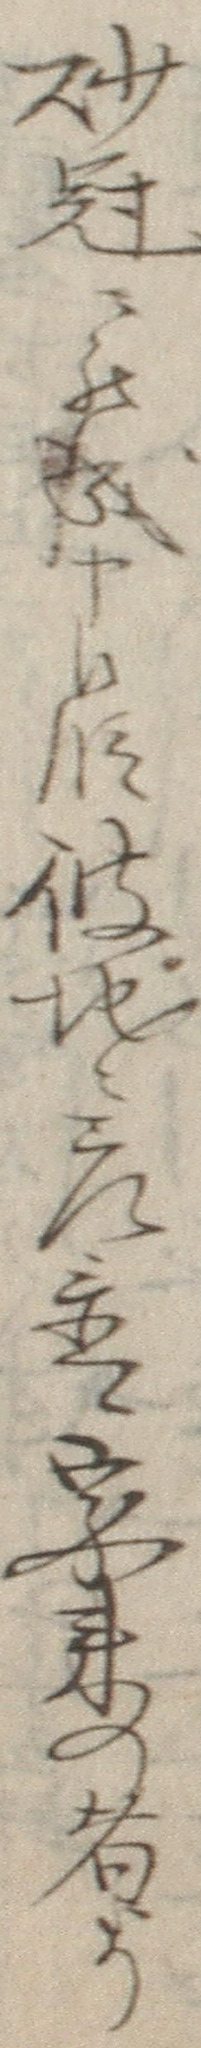砂冠ニ罷成申候段彼地ニ差置候家来の者より
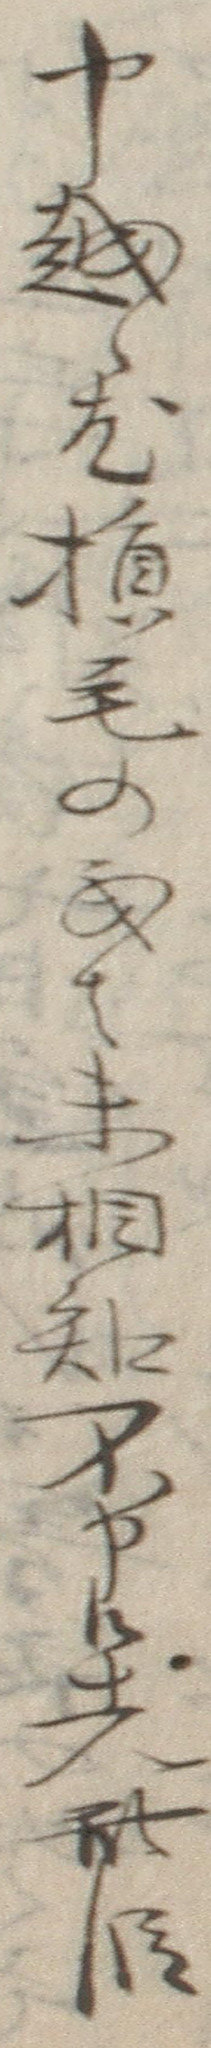申越候尤損毛の義は未相知不申候先此段
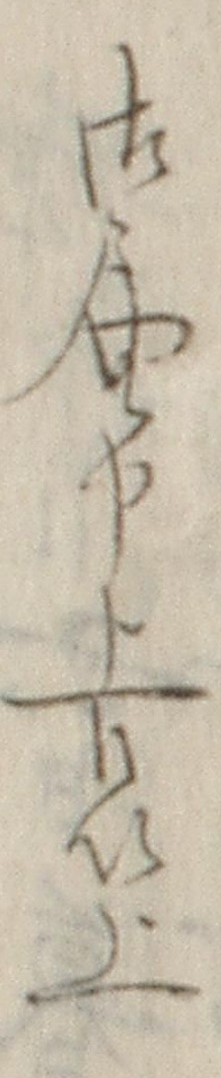御届申上候以上
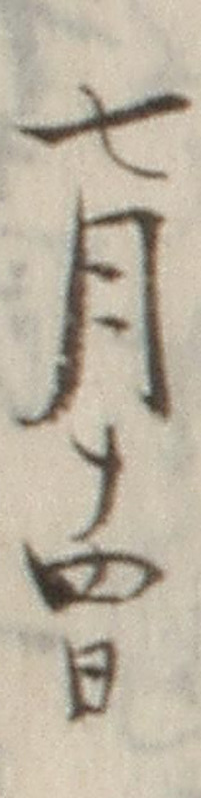七月十四日
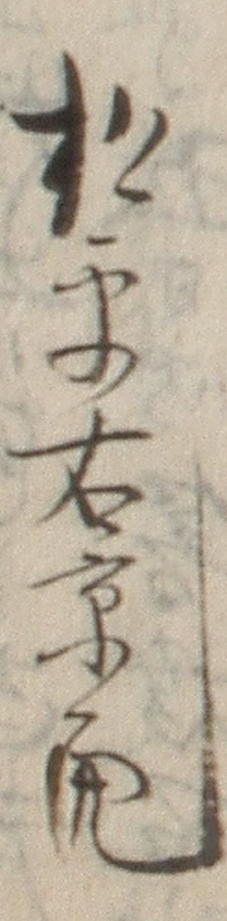松平右京亮

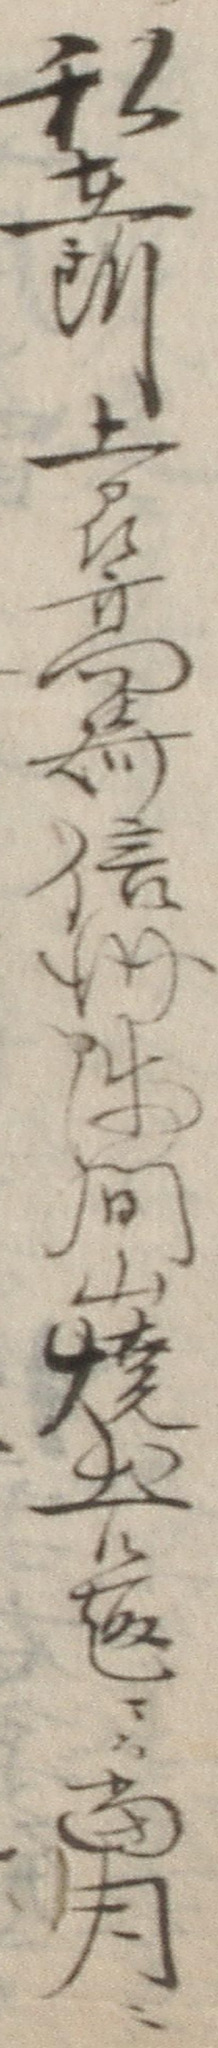私在所上州高崎信州浅間山焼出候趣ニ而当月二
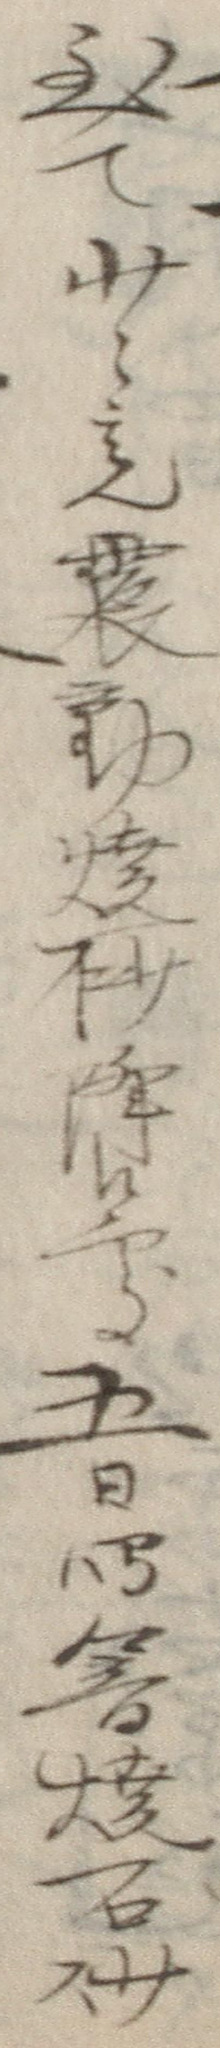至て少々充震動焼砂降候処五日鳴響焼石砂
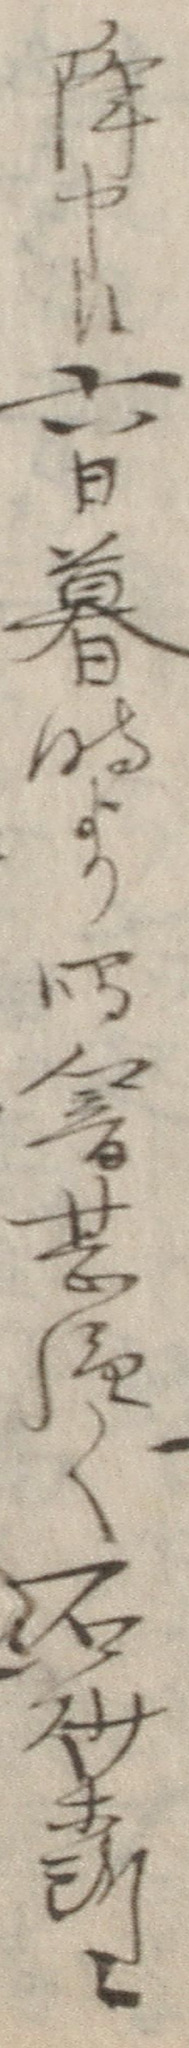降申候六日暮時より鳴響甚強く石砂等所々
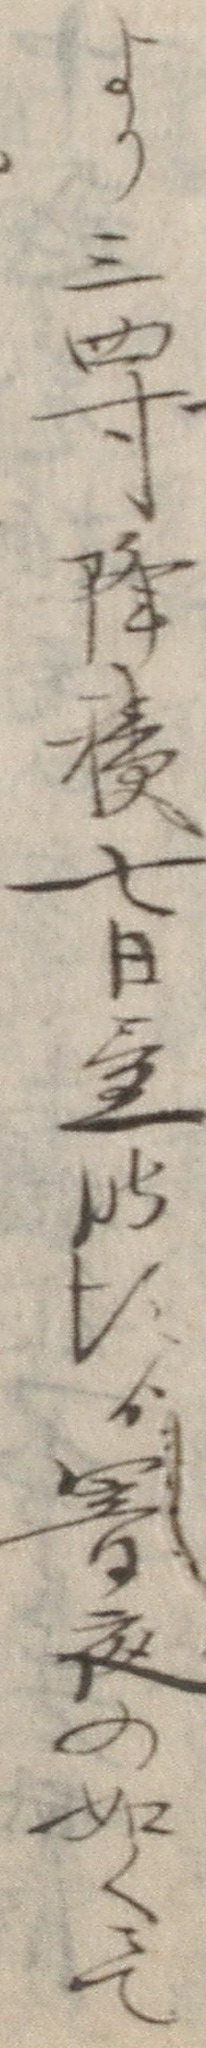より三四寸降積七日昼時頃ゟ闇夜の如くニて
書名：[諸国災害記録]
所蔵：東京大学地震研究所図書室 Earthquake Research Institute Library, The University of Tokyo, JAPAN
